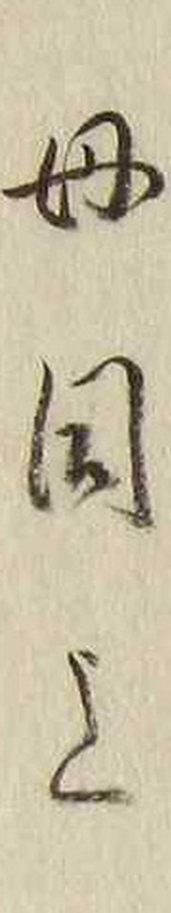母同上

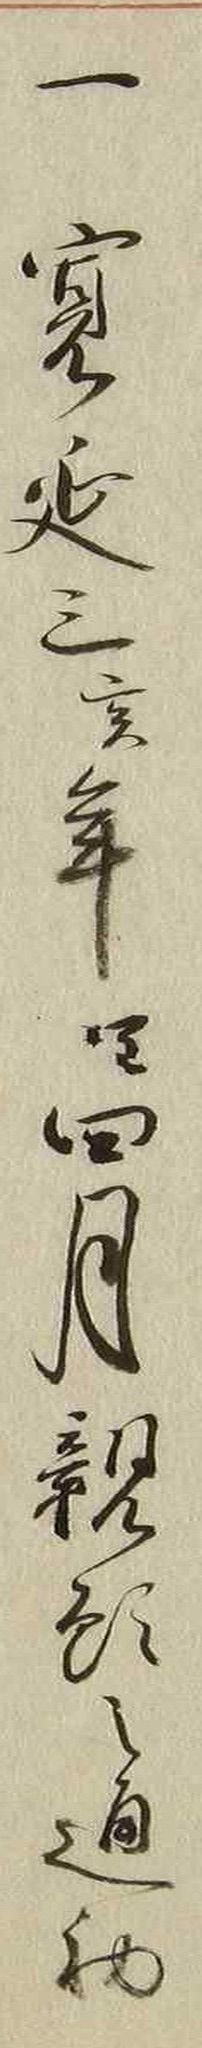一寛延三亥年閏四月親願之通初
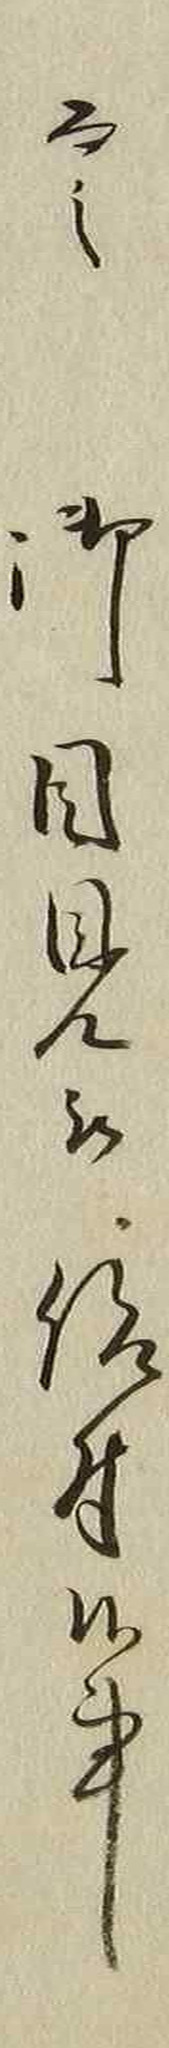而之御目見被仰付候事
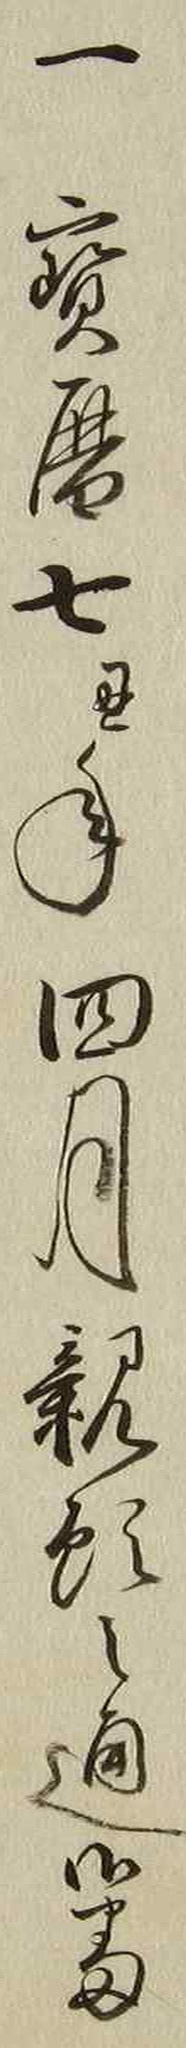一宝暦七丑年四月親願之通御番
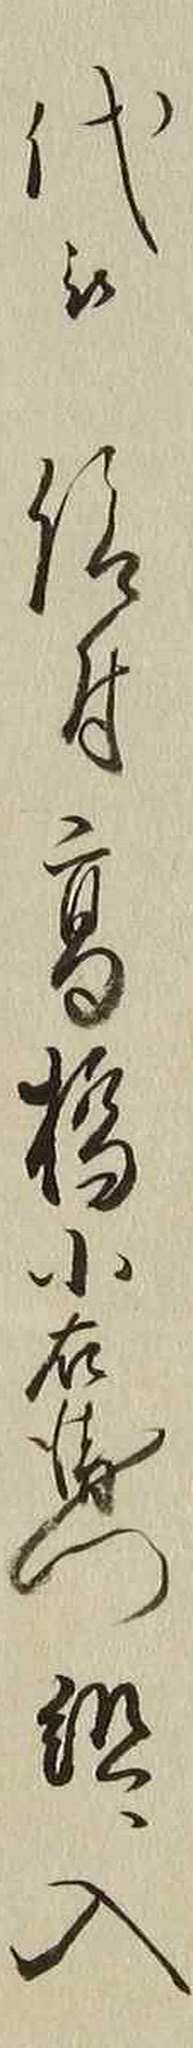代被仰付高橋小右衛門組へ入
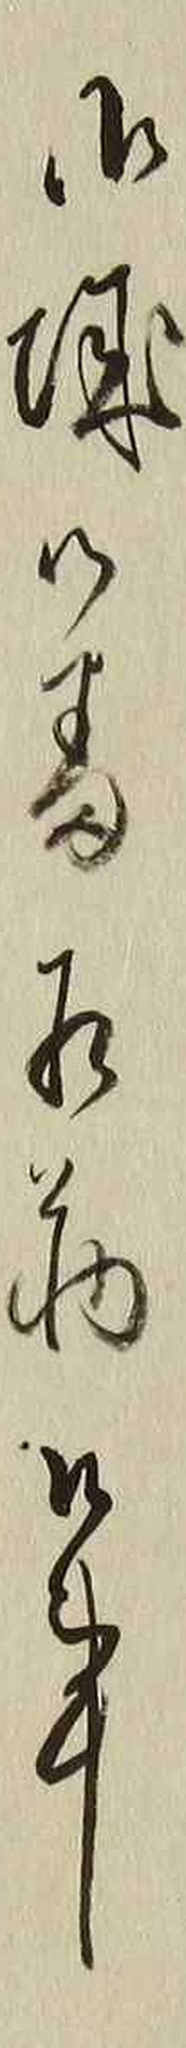御城御番相勤候事
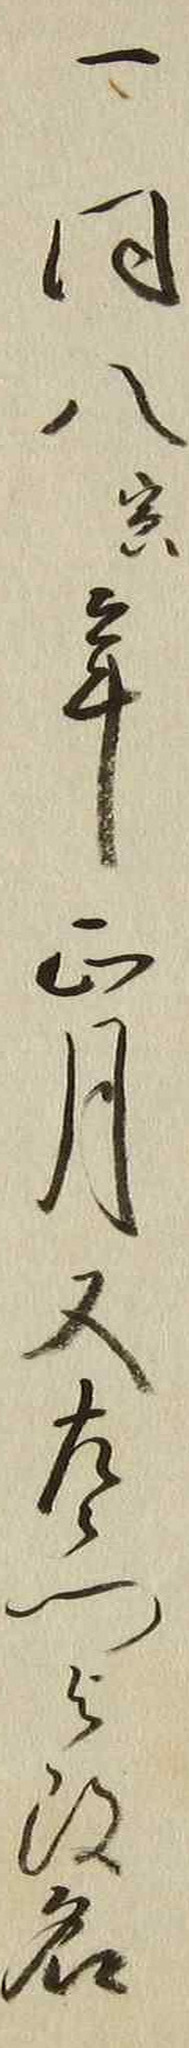一同八寅年正月又左衛門と改名
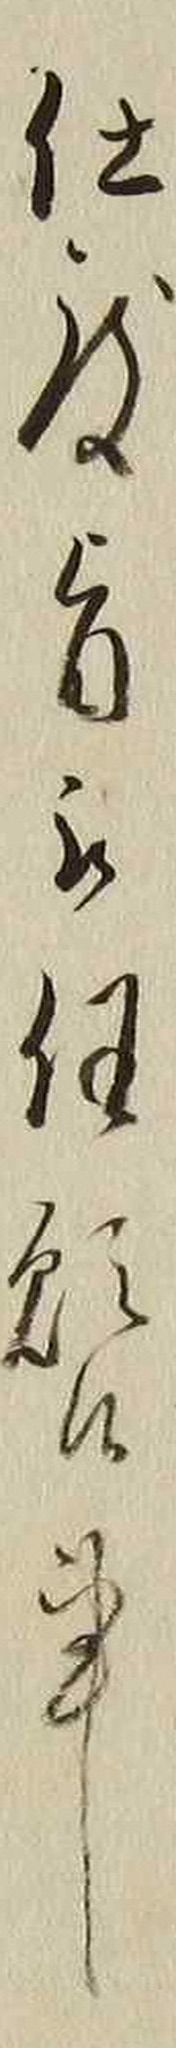仕度旨被任願候事
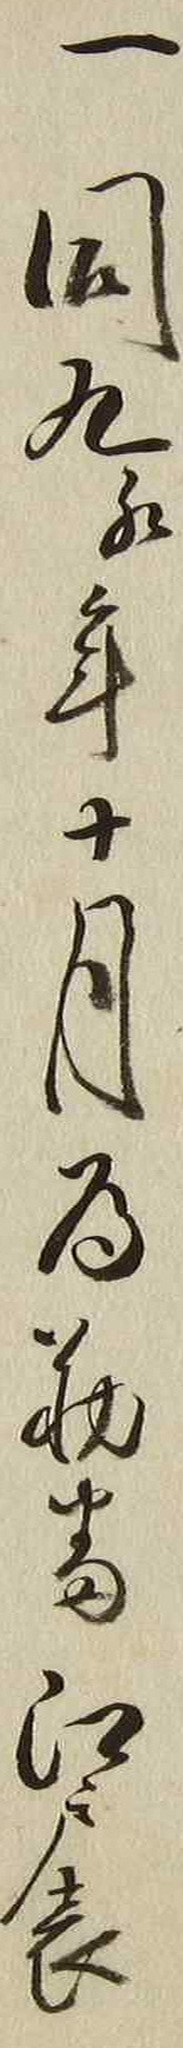一同九卯年十月為勤番江戸表
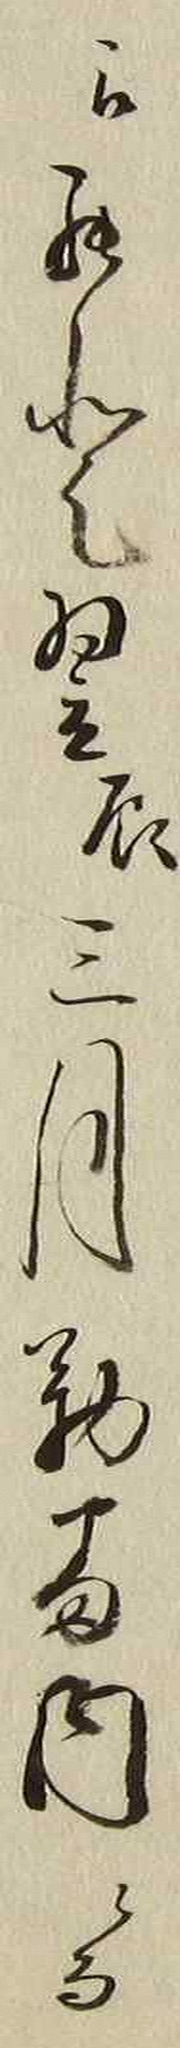江罷登翌辰三月勤番内ニ而
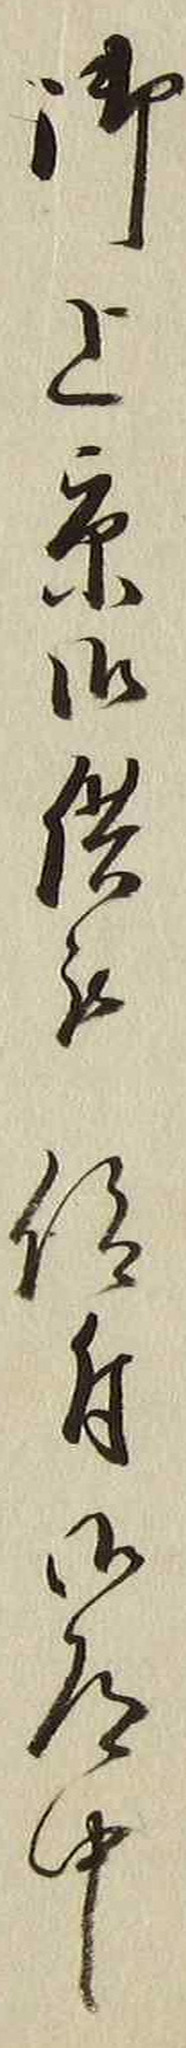御上京御供被仰付御道中
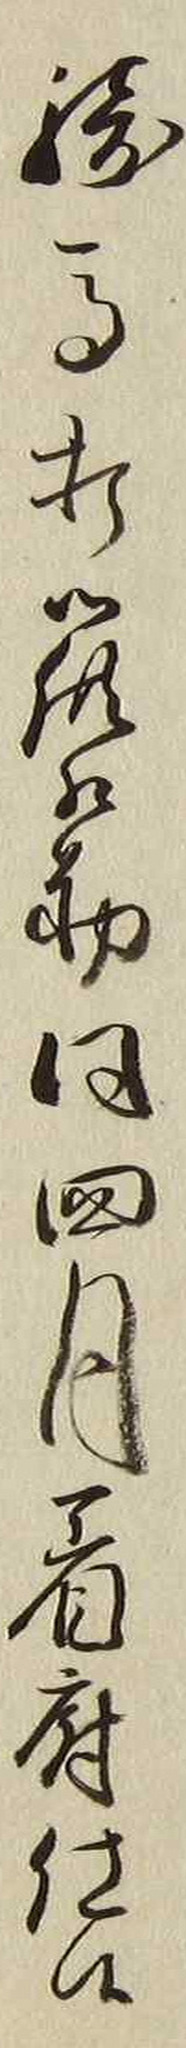騎馬打御供相勤同四月着府仕候
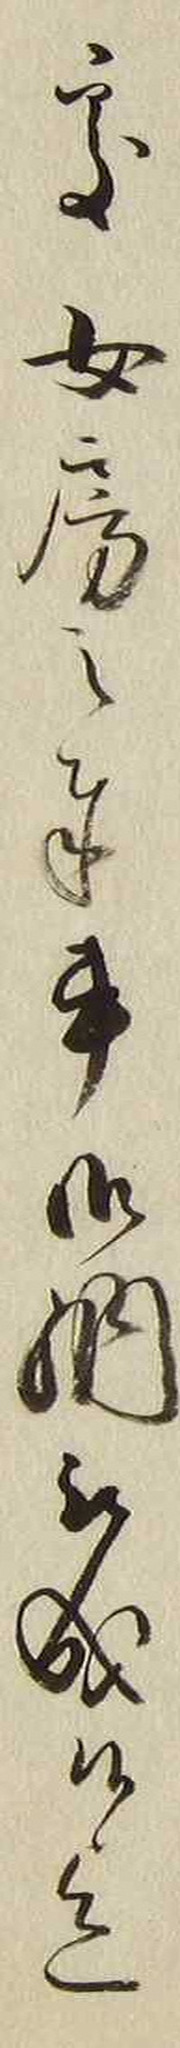処女房之奉事御納被成候迄
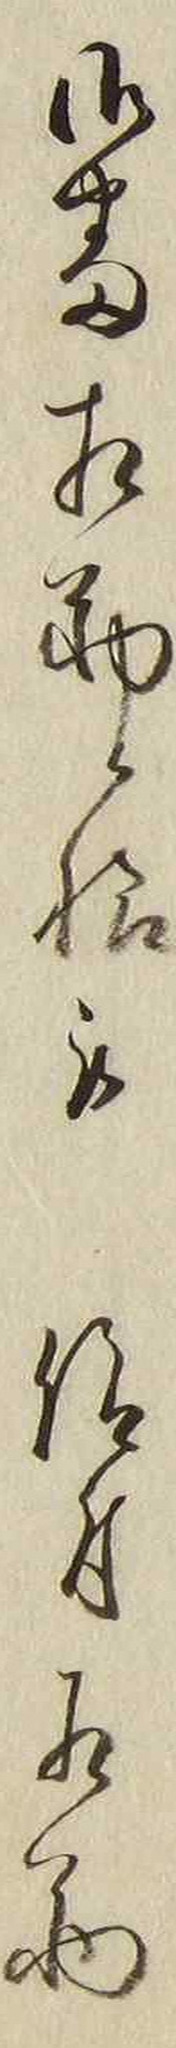御番相勤候様被仰付相勤
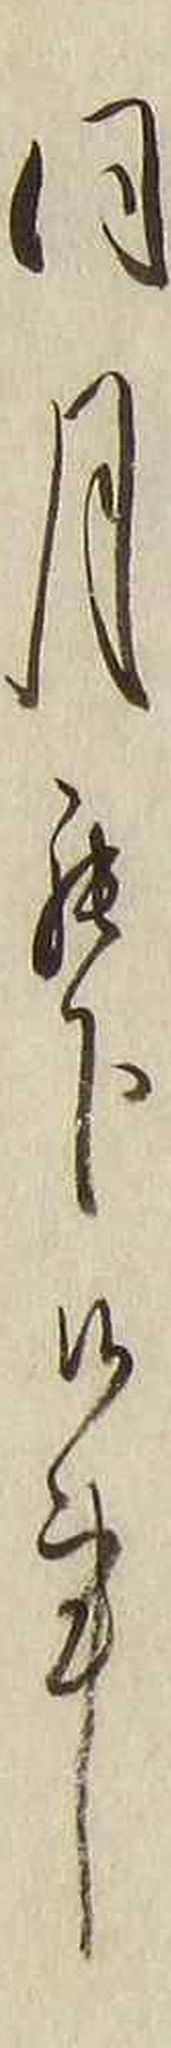同月罷下候事

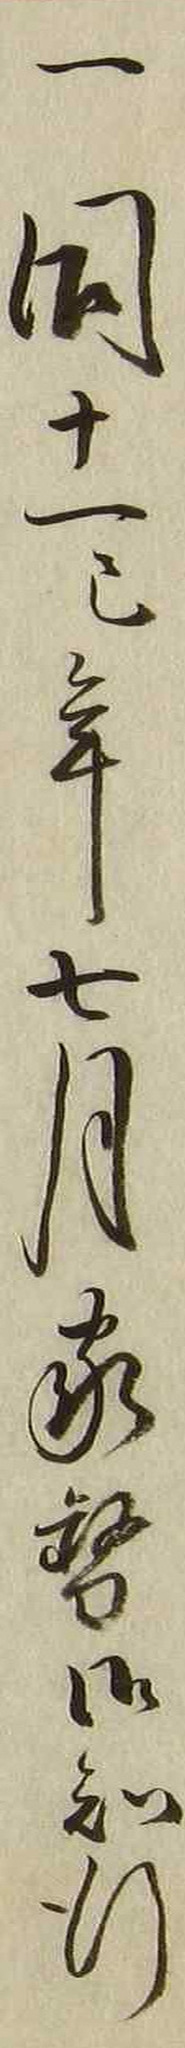一同十一巳年七月家替御知行
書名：諸士系譜　巻之18　い之部18
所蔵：会津若松市立会津図書館
